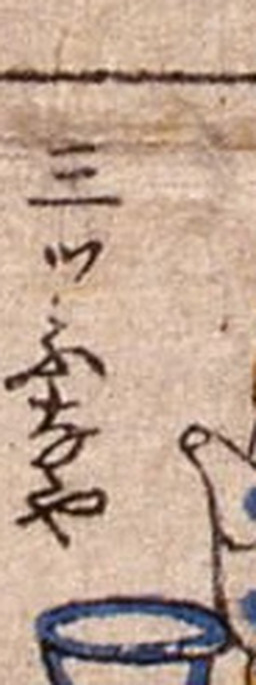三つふなや
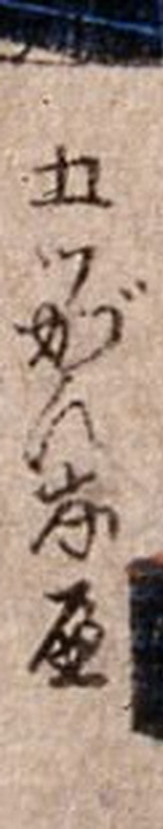五つがんなべ
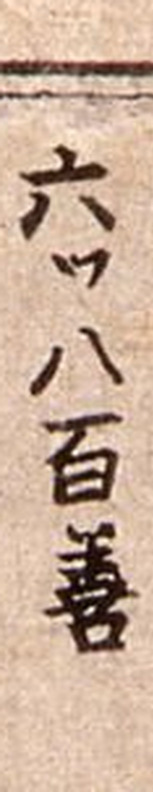六つ八百善
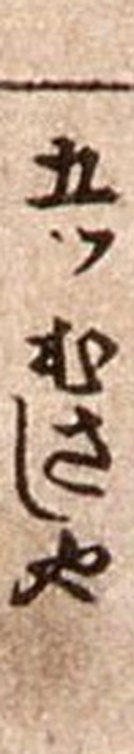五つむさしや
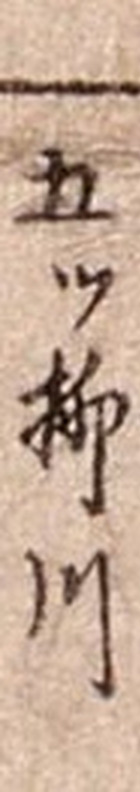五つ柳川
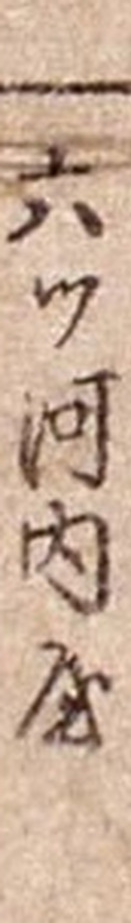六つ河内屋
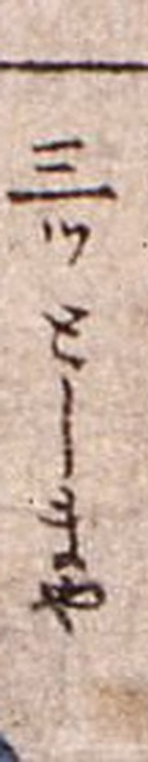三つとしまや
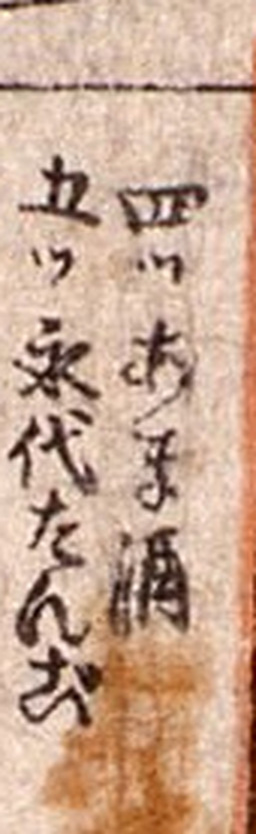五つ永代たんご
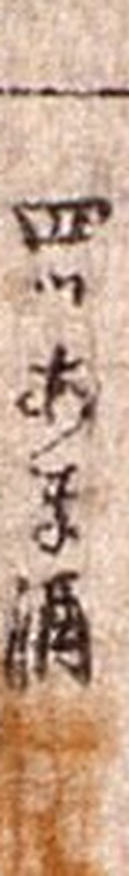四つあま酒
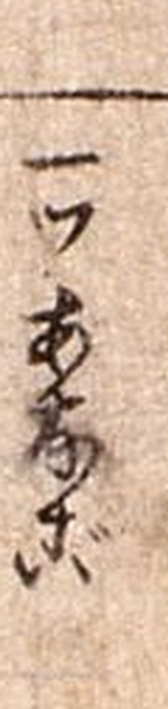一つあなご
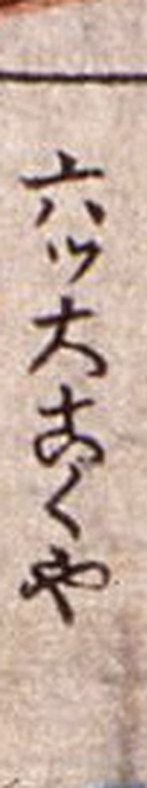六つ大こくや
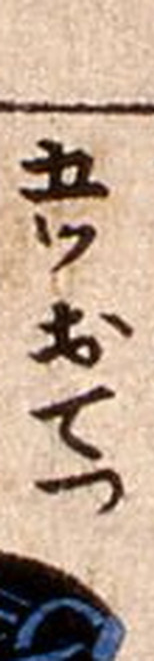五つおてつ
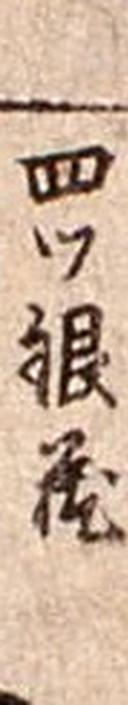四つ銀蔵
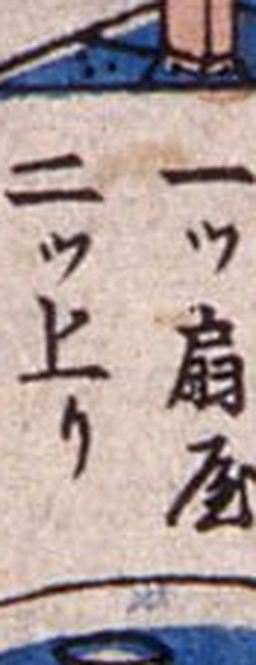二つ上り
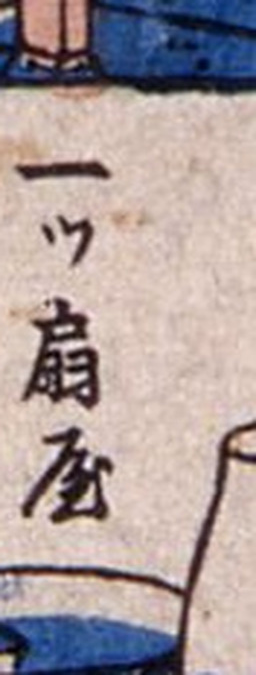一つ扇屋
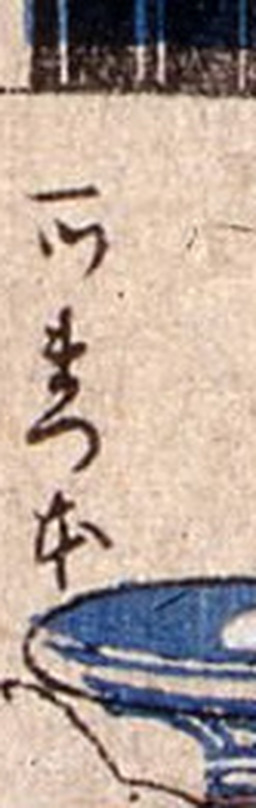一つまつ本
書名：新版御府内流行名物案内雙六
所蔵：東京学芸大学附属図書館
